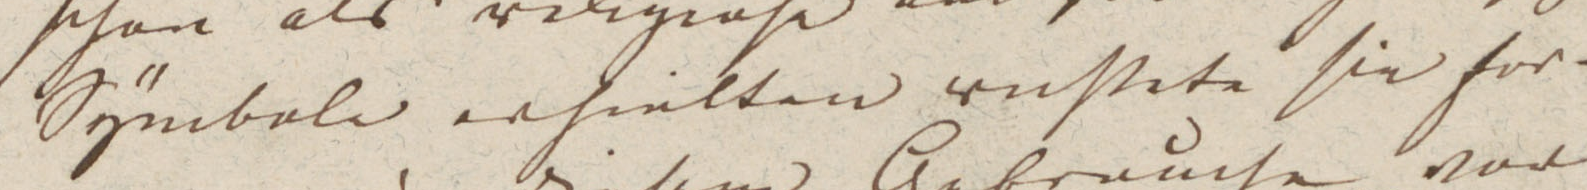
Symbole erhielten richtete sie for-
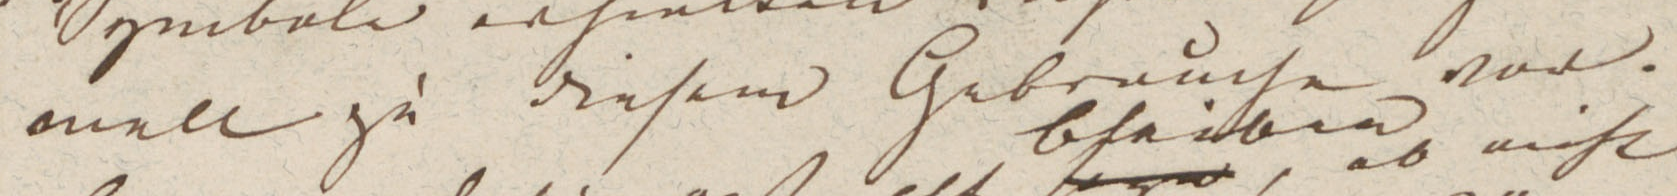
mell zu diesem Gebrauche vor.
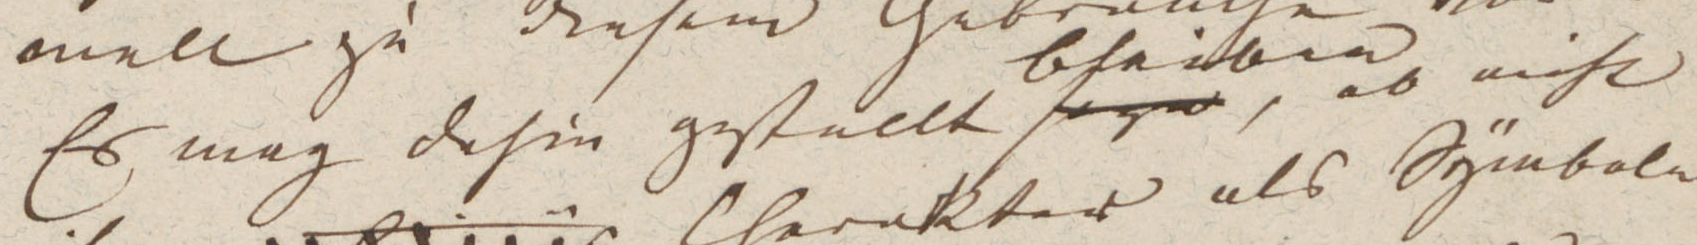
Es mag dahin gestellt seyn bleiben, ob nicht
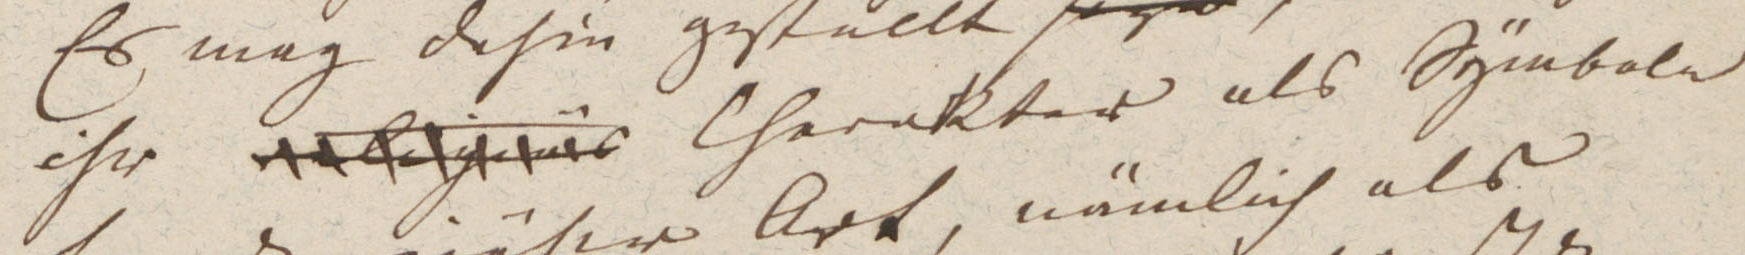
ihr teligiös Charakter als Symbole
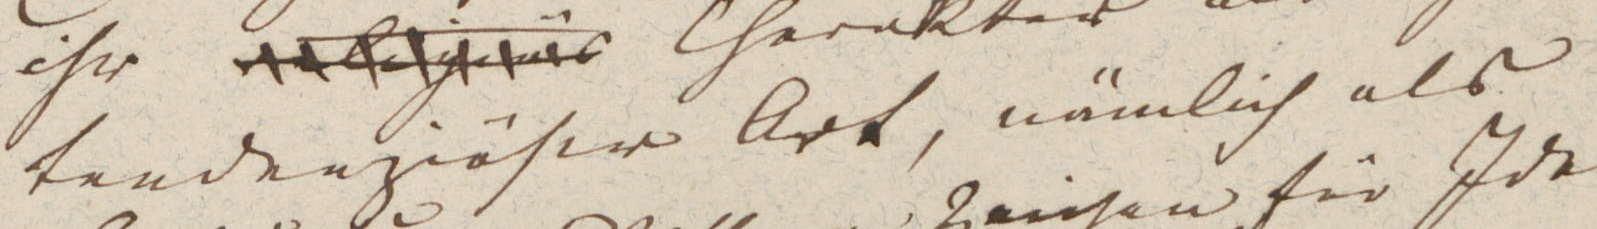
tendenziöser Art, nämlich als
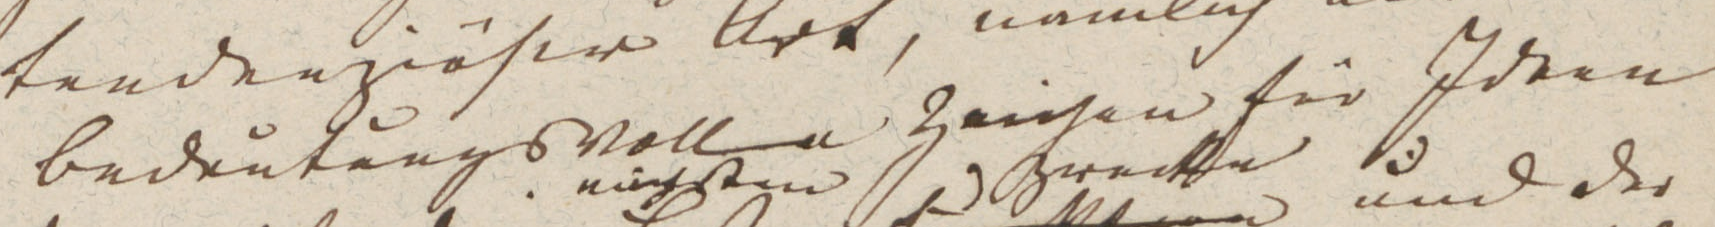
bedeutungsvolle Zeichen für Ideen
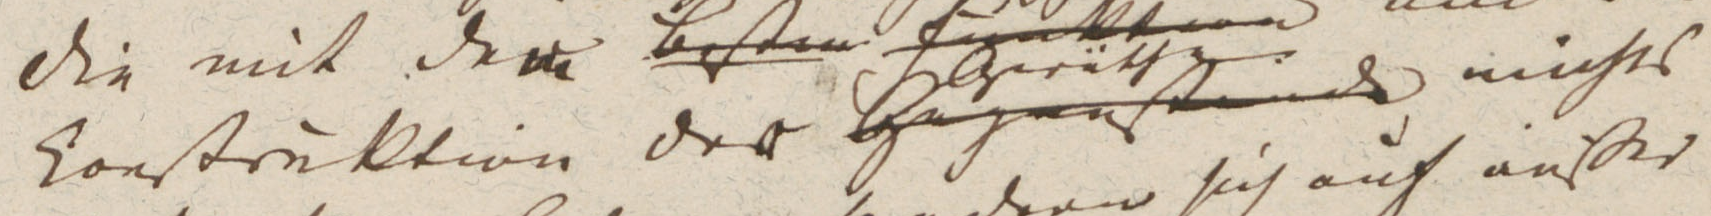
Construktion der Gegenstände Geräthe nichts
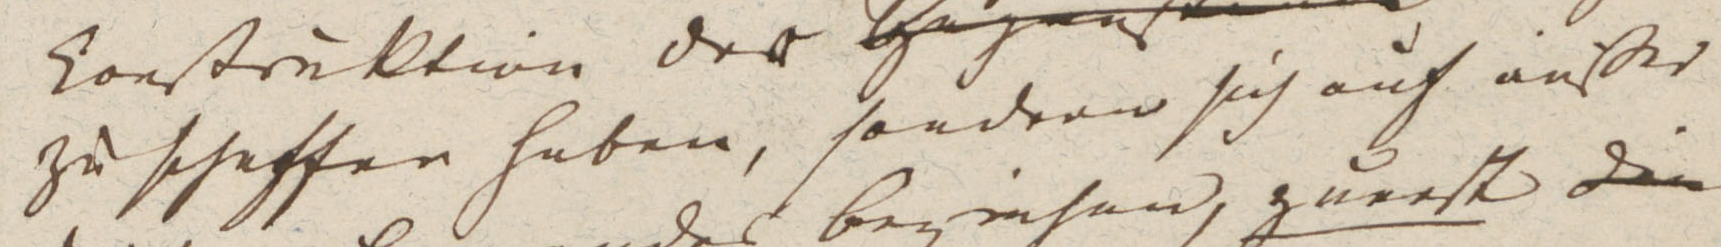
zu schaffen haben, sondern sich auf ausser
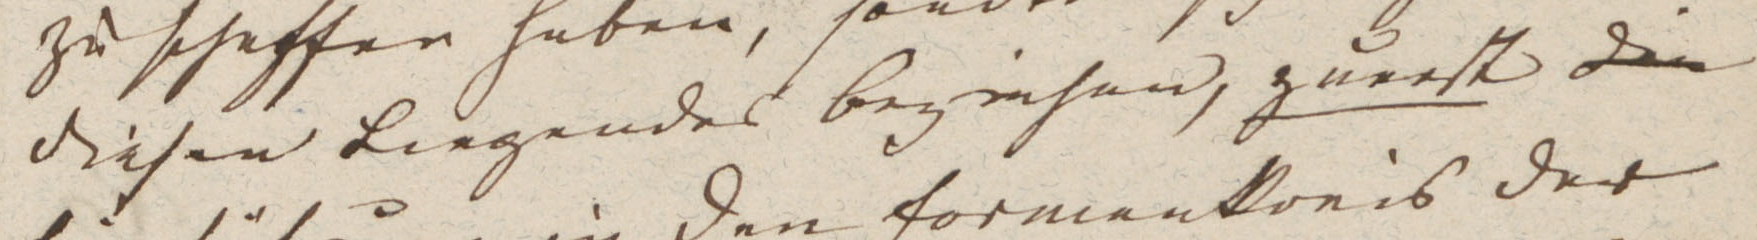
diesen Liegendes beziehen, zuerst die
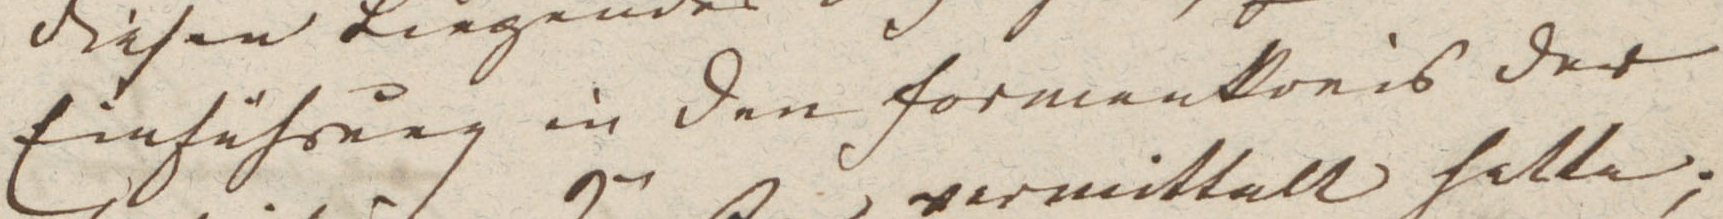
Einführung in den Formenkreis der
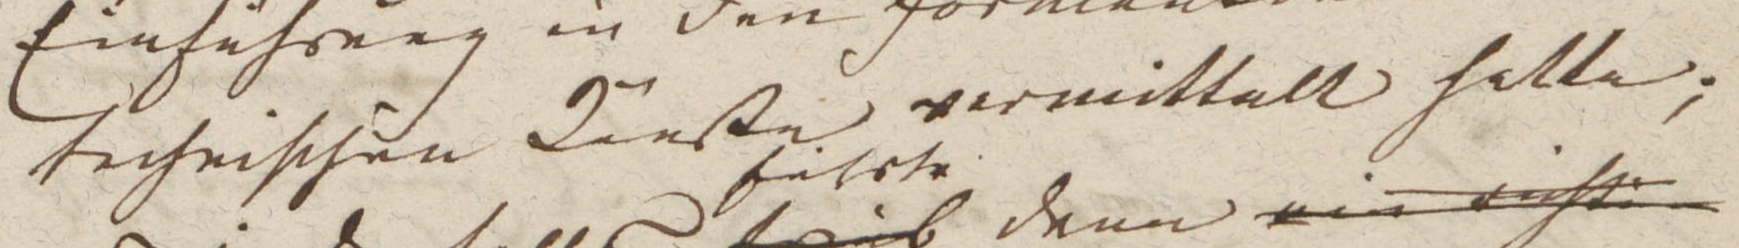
technischen Künste vermittelt hatte;
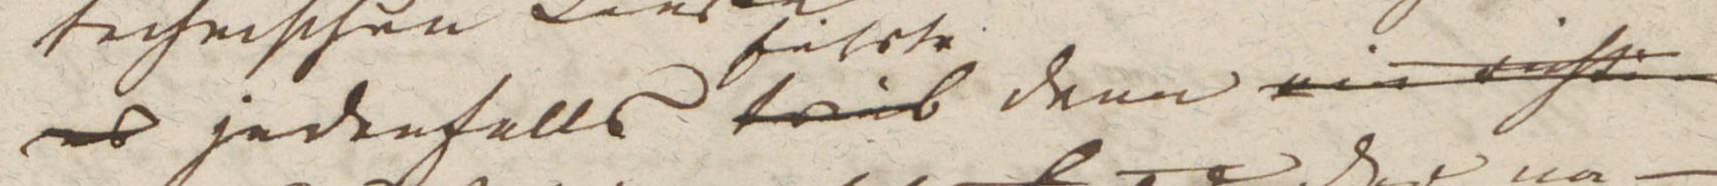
es jedenfalls trieb führte dann ein richti-
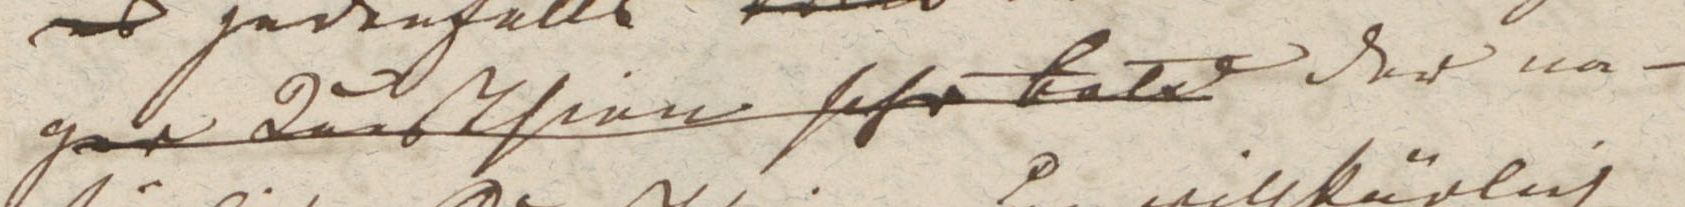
ger Kunstsinn sehr bald der na-
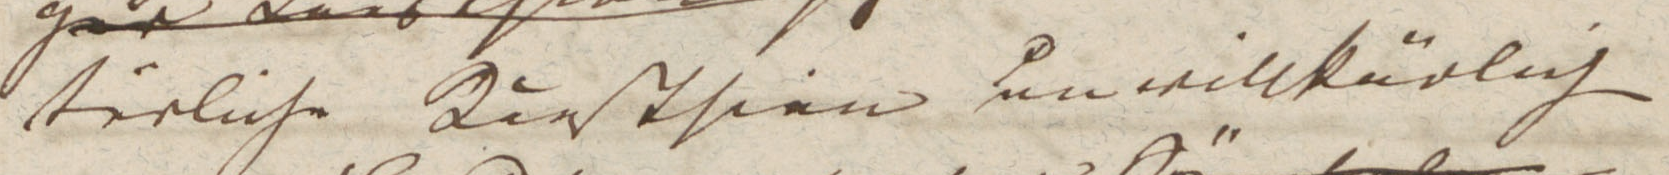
türliche Kunstsinn unwillkürlich
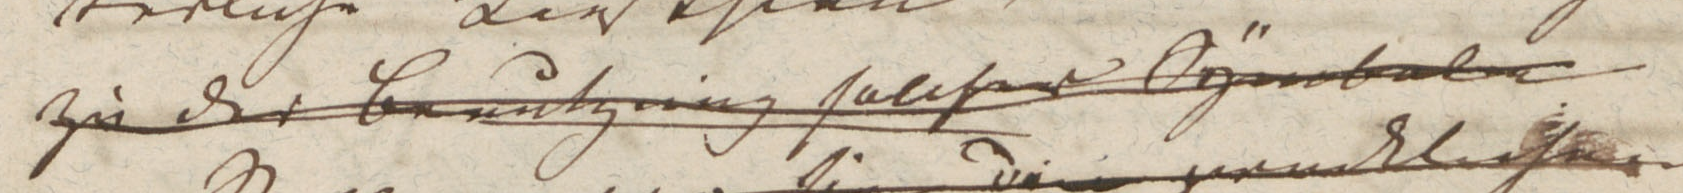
zu der Benutzung solcher Symbole
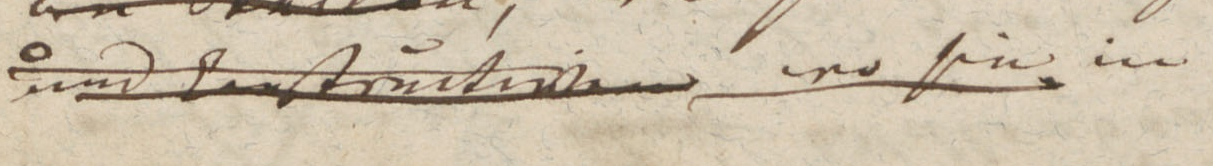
und Constructiven wo sie in
